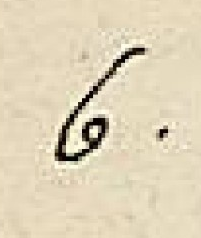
6.
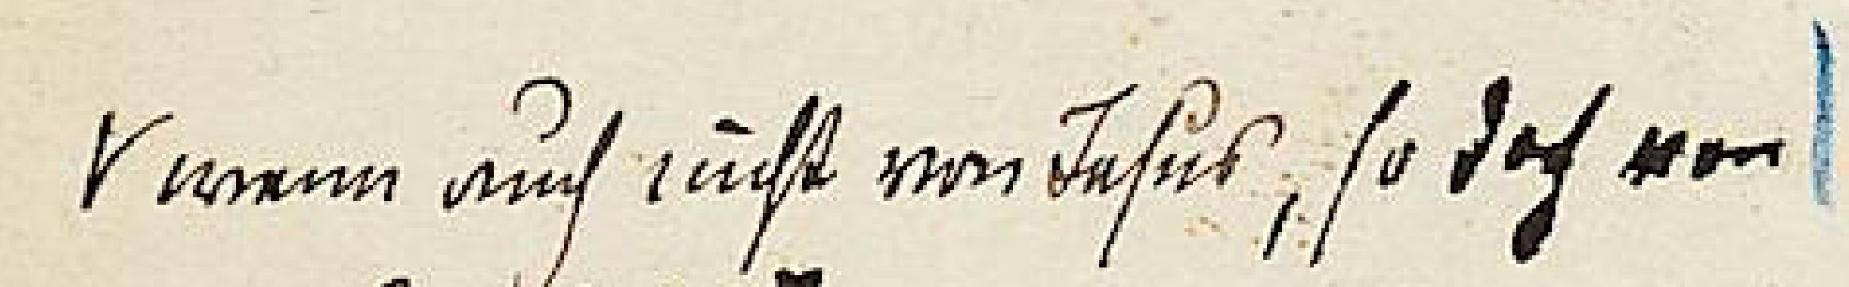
V wenn auch nicht von Jesus, so doch von
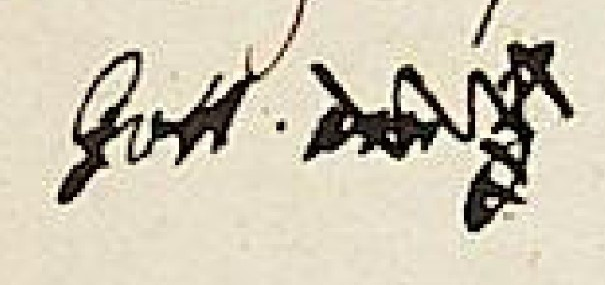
Gott ein Z
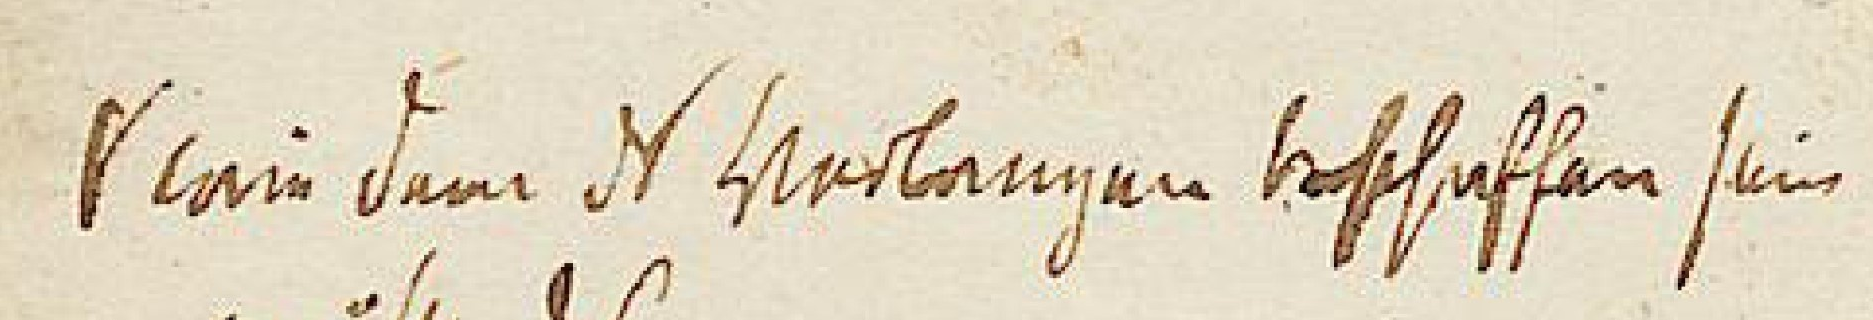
V wie dem d Verlangen beschaffen sein
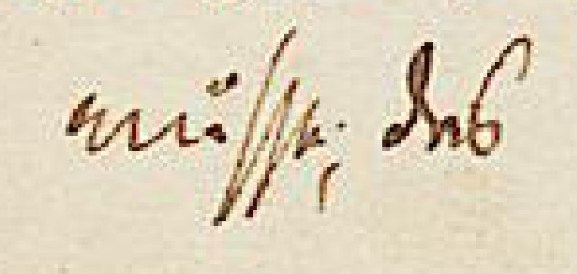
müste, das
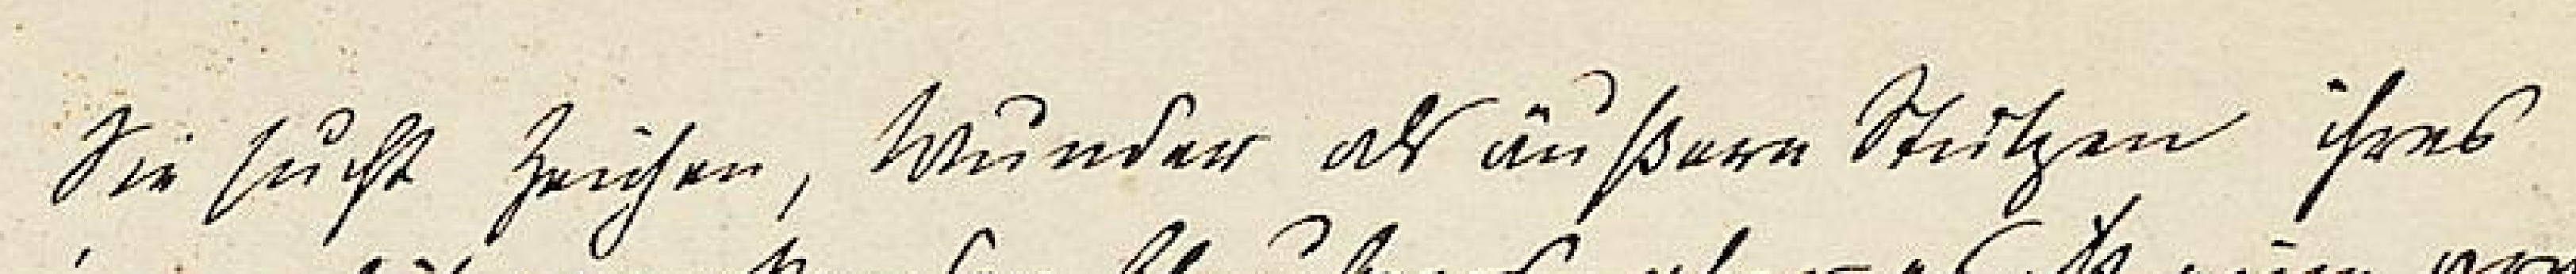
Sie sucht Zeichen, Wunder als äußere Stützen ihres
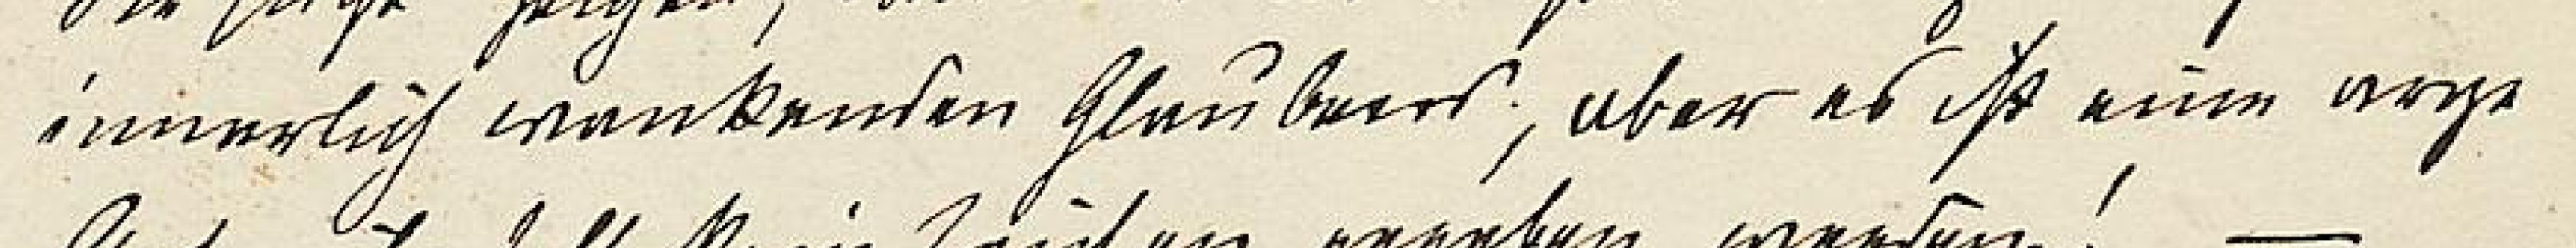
innerlich wankenden Glaubens, aber es ist eine vage
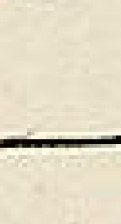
_
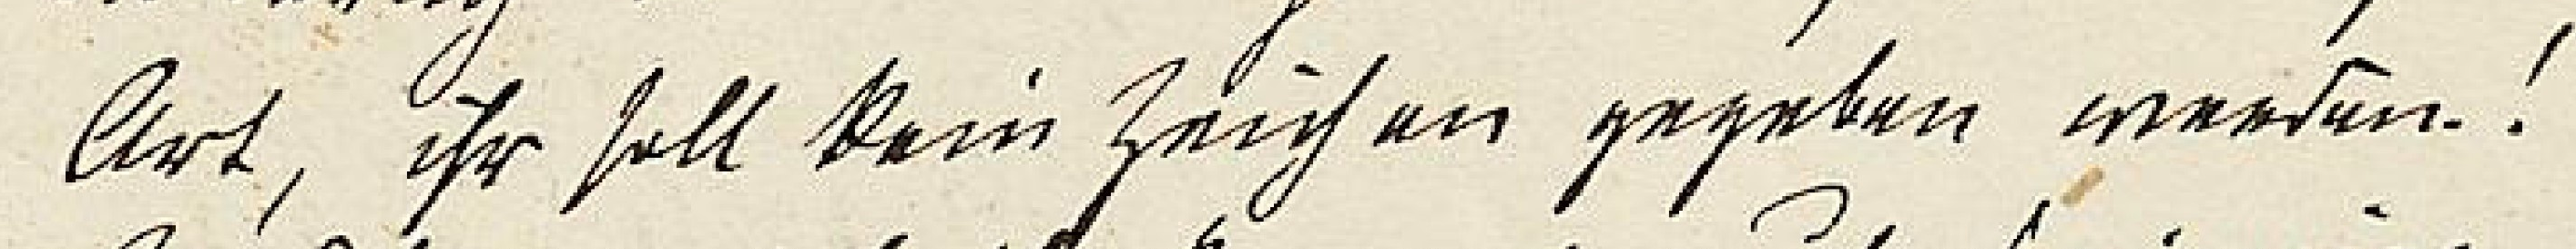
Art, ihr soll kein Zeichen gegeben werden.
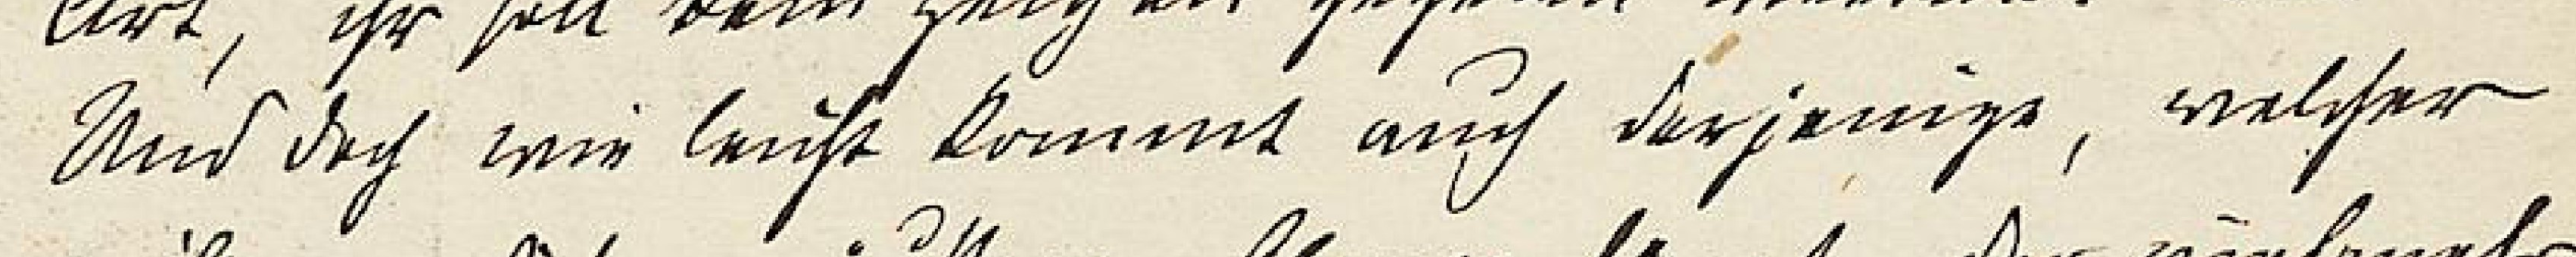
Und doch wie leicht kommt auf derjenige, welcher
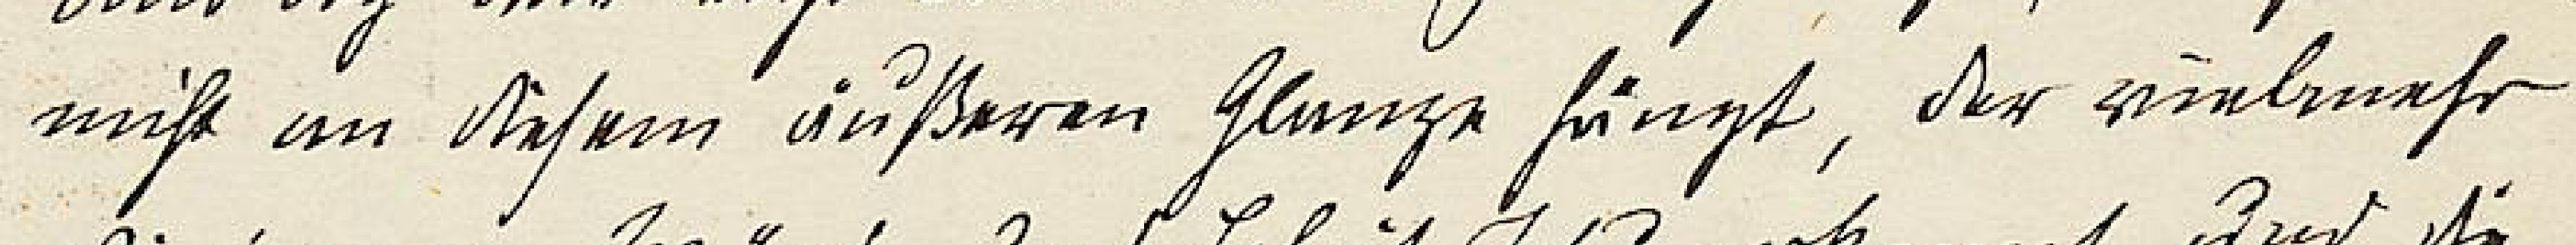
nicht an diesem äußeren Glanze hängt, der vielmehr
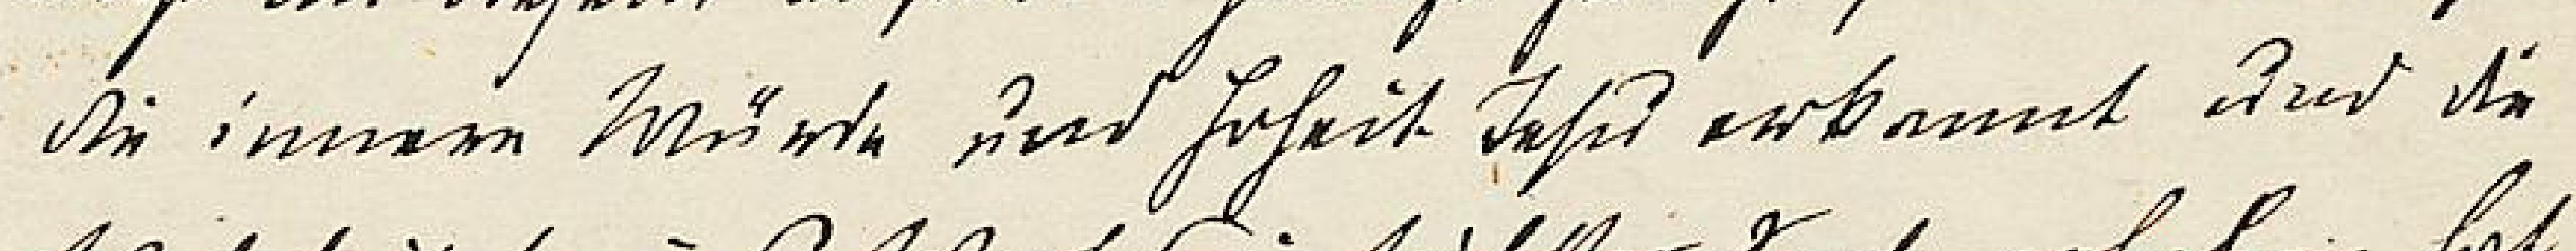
die innere Würde und Hoheit Jesu erkannt und die
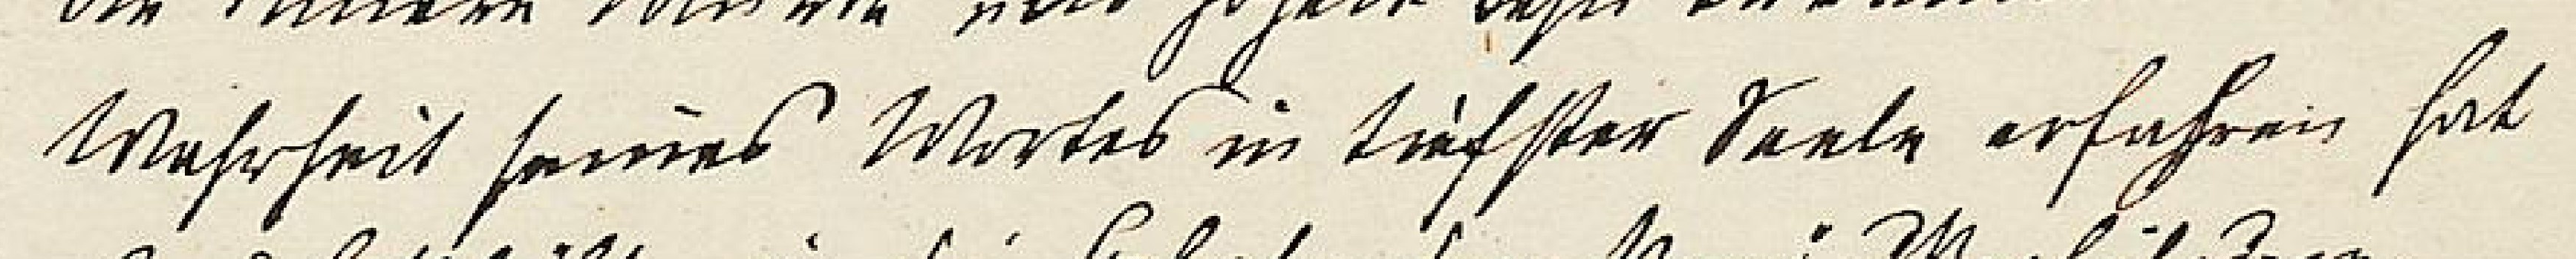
Wahrheit seines Wortes in tiefster Seele erfahren hat
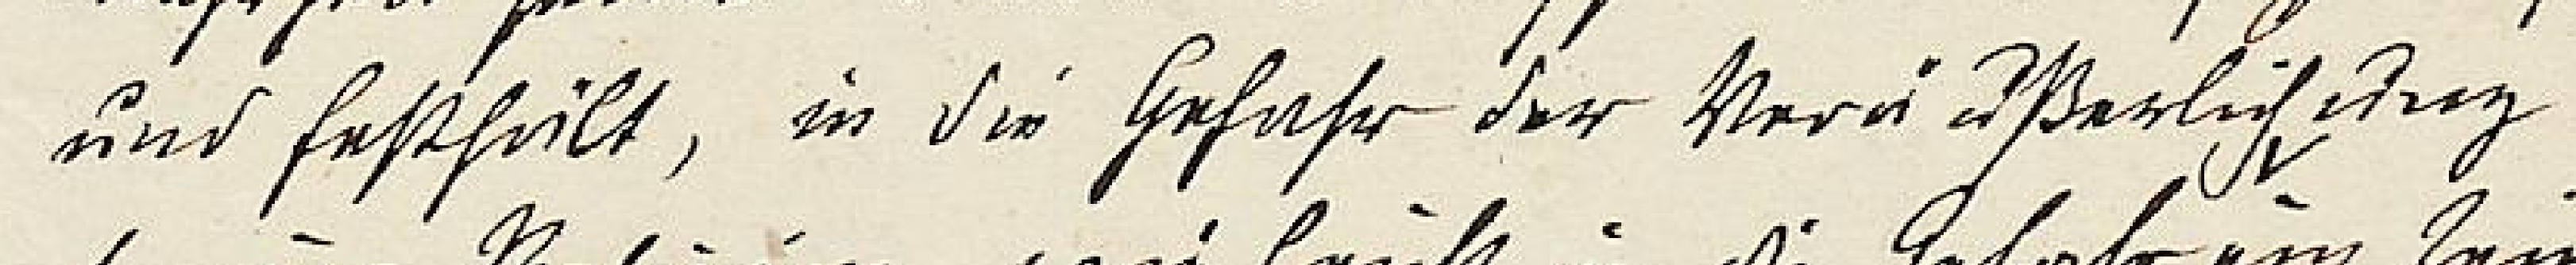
und festhält, in die Gefahr der Veräußerlichung
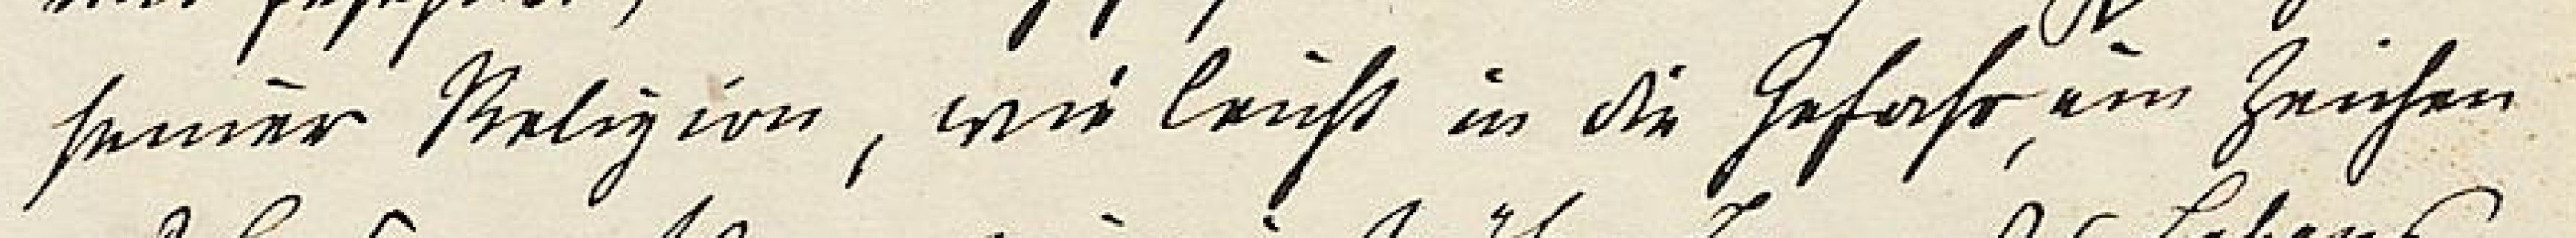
seiner Religion, wie leicht in die Gefahr ein Zeichen
